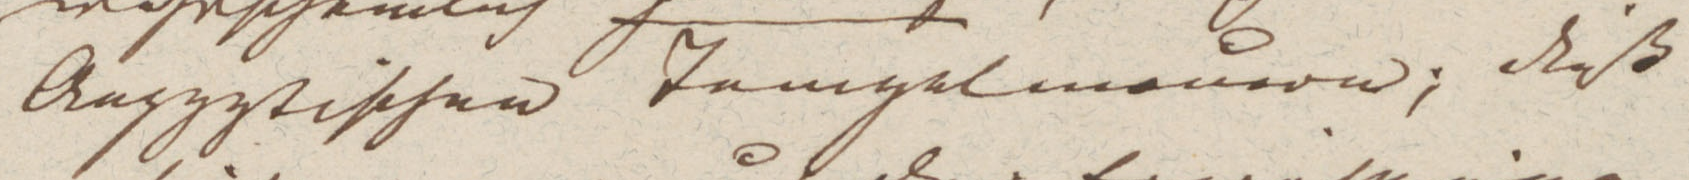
Aegyptischen Tempelmauern; diess
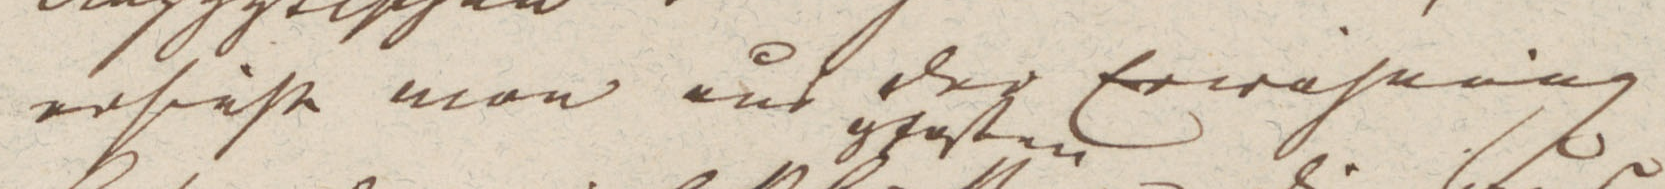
ersieht man aus der Erwähnung
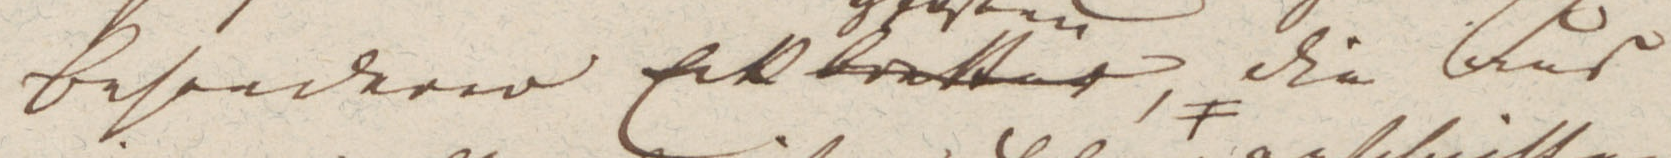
"besonderer Eckbretterpfosten, die aus
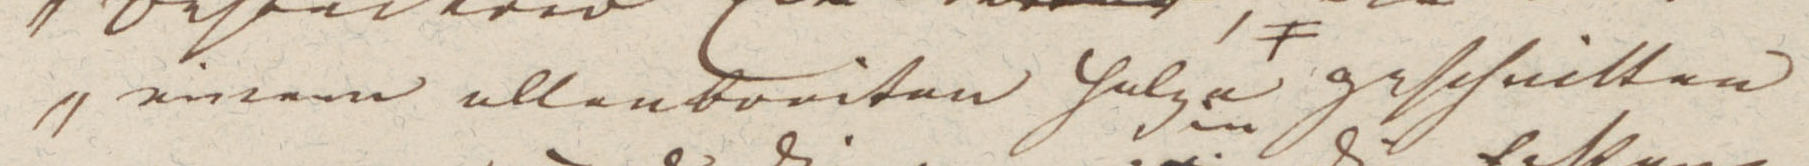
"einem ellenbreiten Holze % geschnitten
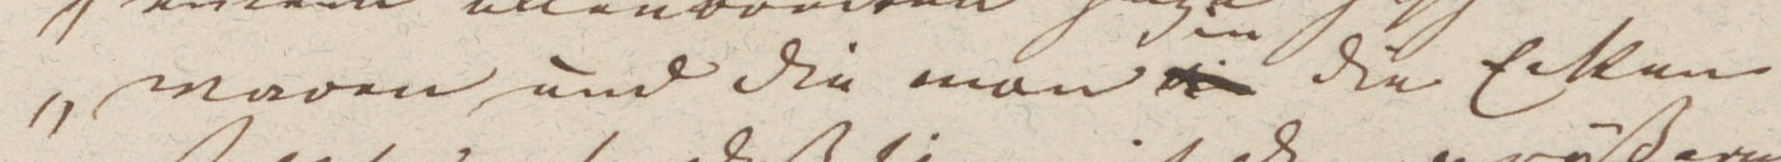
"waren und die man in die Ecken
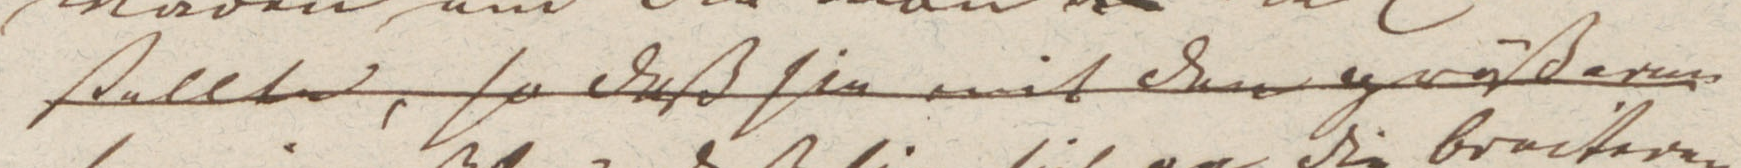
stellte, so dass sie mit den grösseren
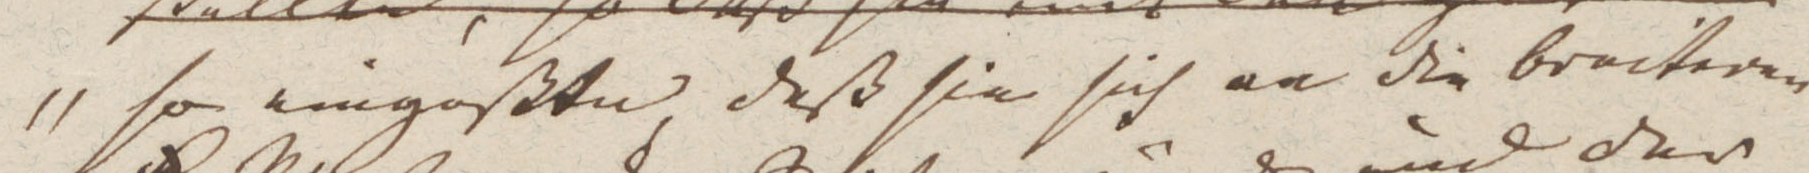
"so einpasste, dass sie sich an die breiteren
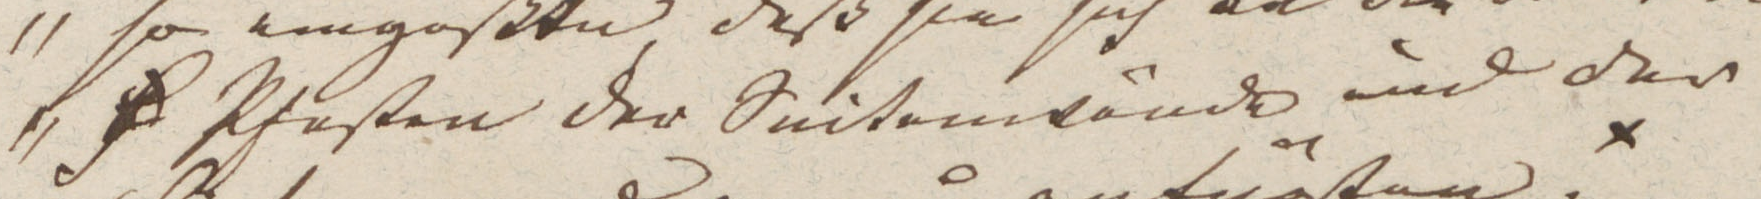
" Pfosten der Seitenwände und der
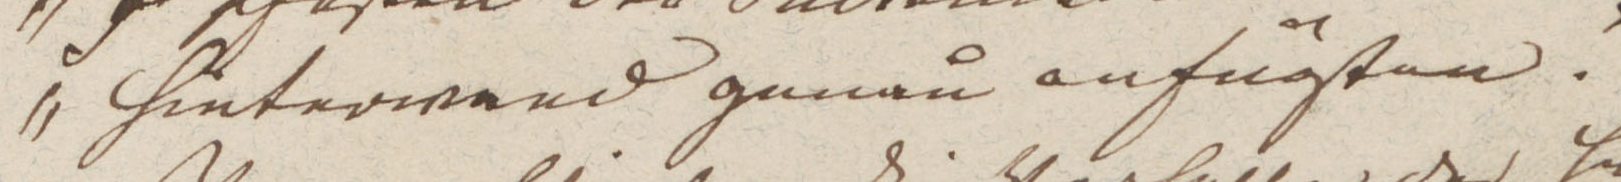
"Hinterwand genau anfügten.%
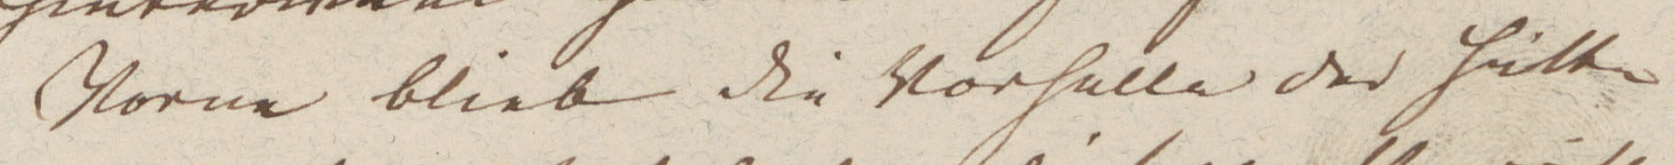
Vorne blieb die Vorhalle der Hütte
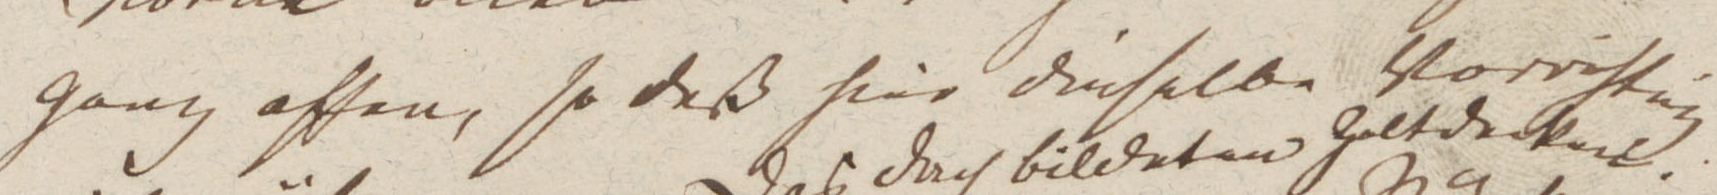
ganz offen, so dass hier dieselbe Vorrichtung
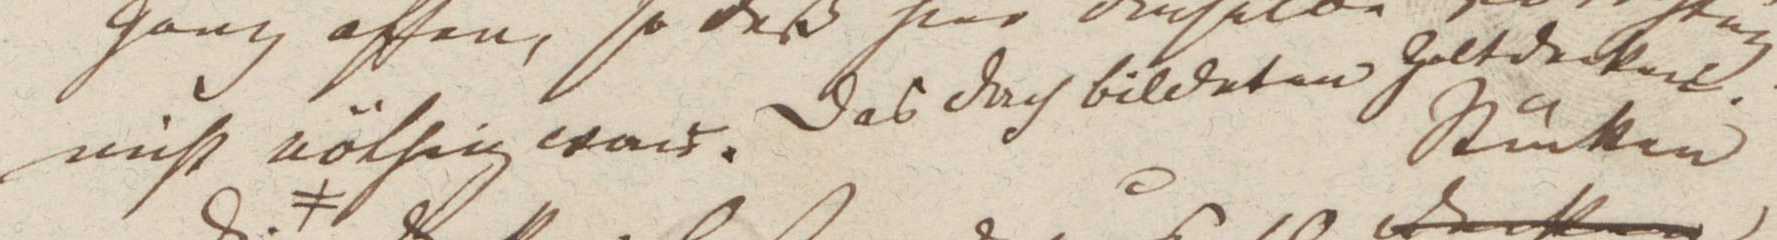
nicht nöthig war. Das Dach bildeten Zeltdecken.
